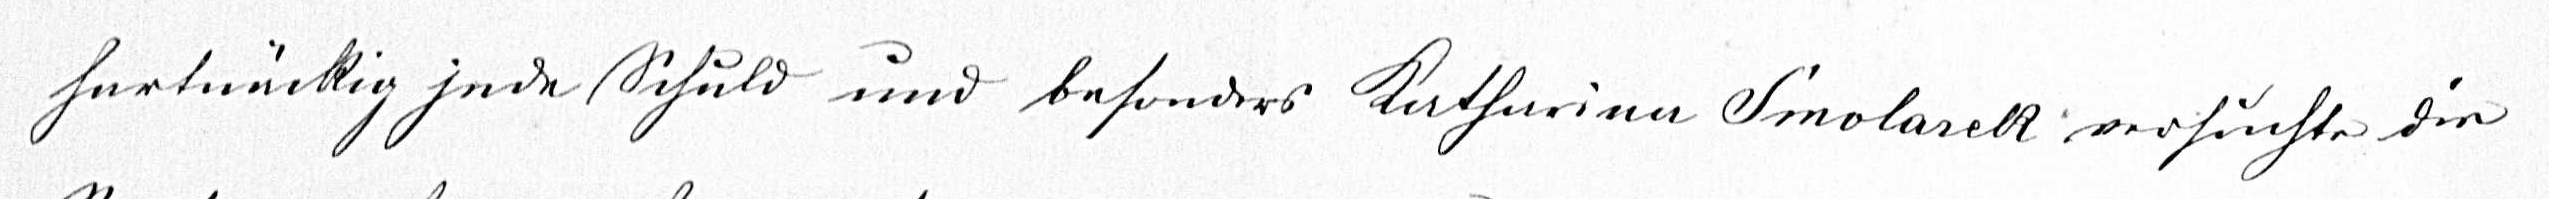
hartnäckig jede Schuld und besonders Katharina Smolarek versuchte die
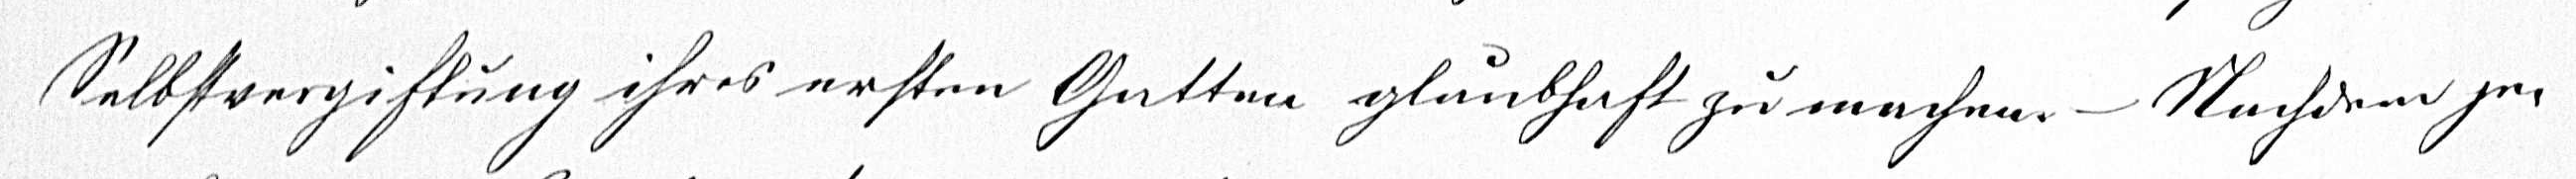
Selbstvergiftung ihres ersten Gatten glaubhaft zu machen. Nachdem je¬
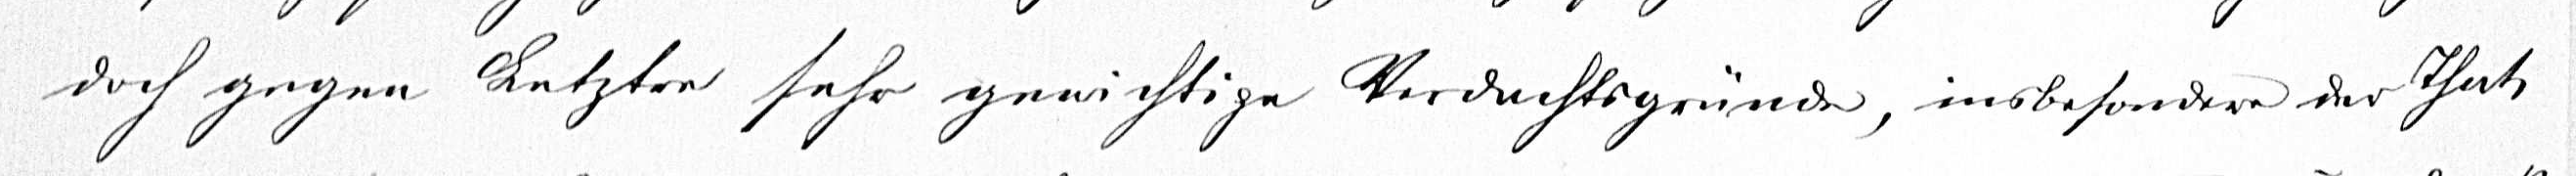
doch gegen Letzter sehr gewichtige Verdachtsgründe, insbesondere der That¬
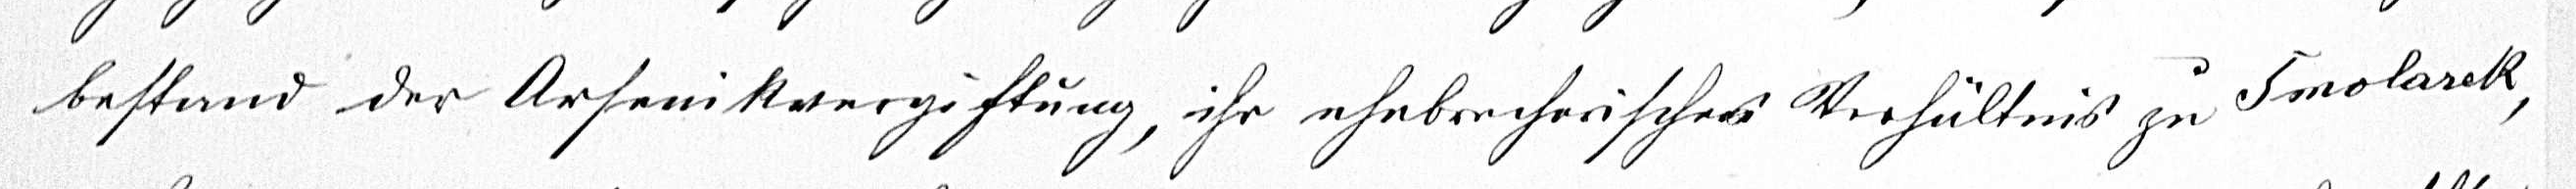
bestand der Arsenikvergiftung, ihr ehebrecherisches Verhältnis zu Smolarek,
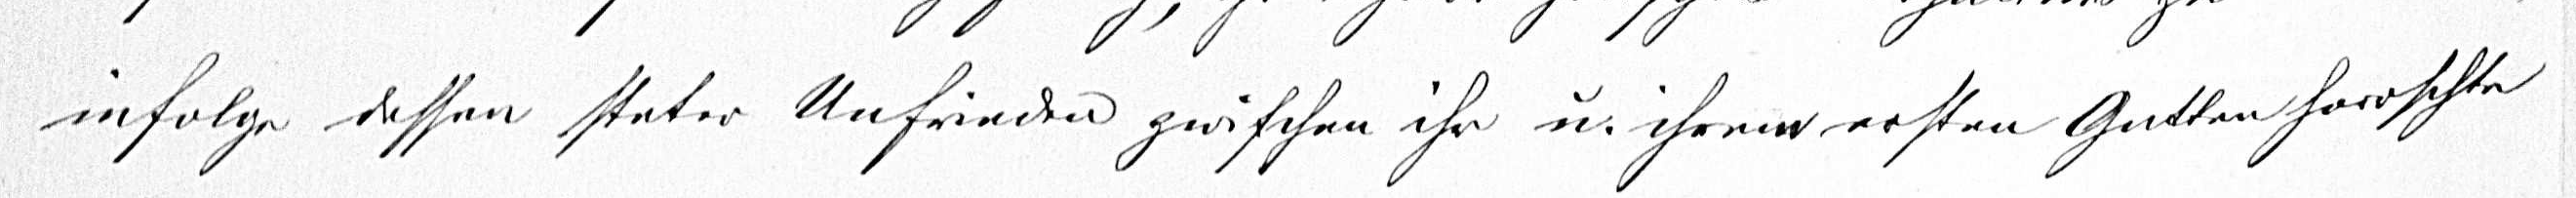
infolge dessen steter Unfrieden zwischen ihr u. ihrem ersten Gatten herrschte
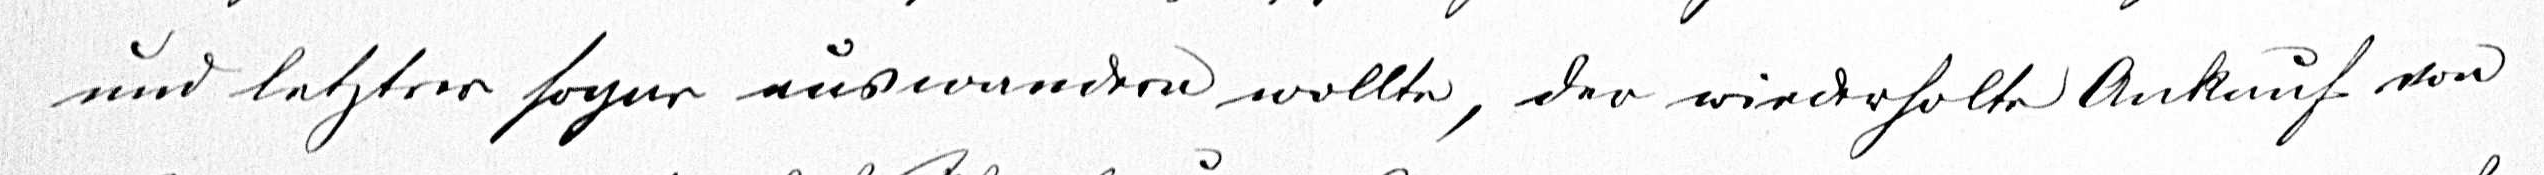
und letzter sogar auswandern wollte, der wiederholte Ankauf von
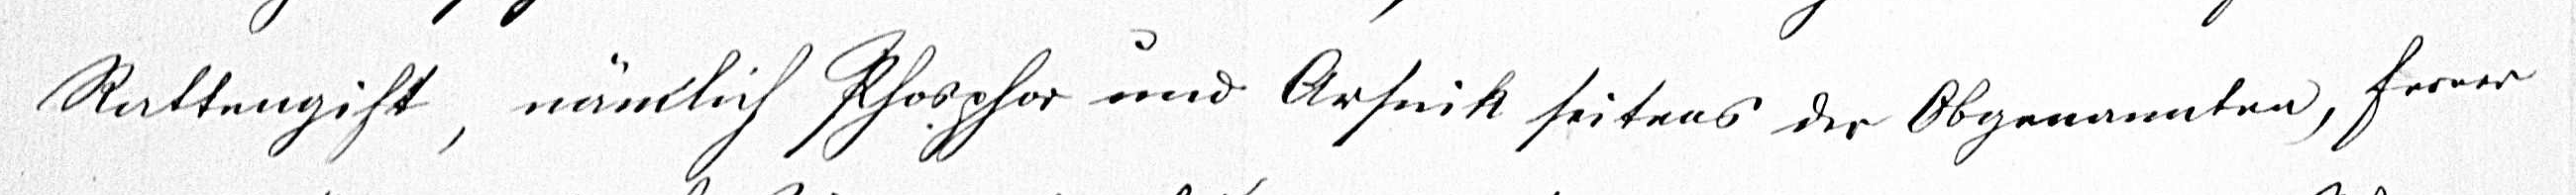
Rattengift, nämlich Phosphor und Arsenik seitens der Obgenannten, ferner
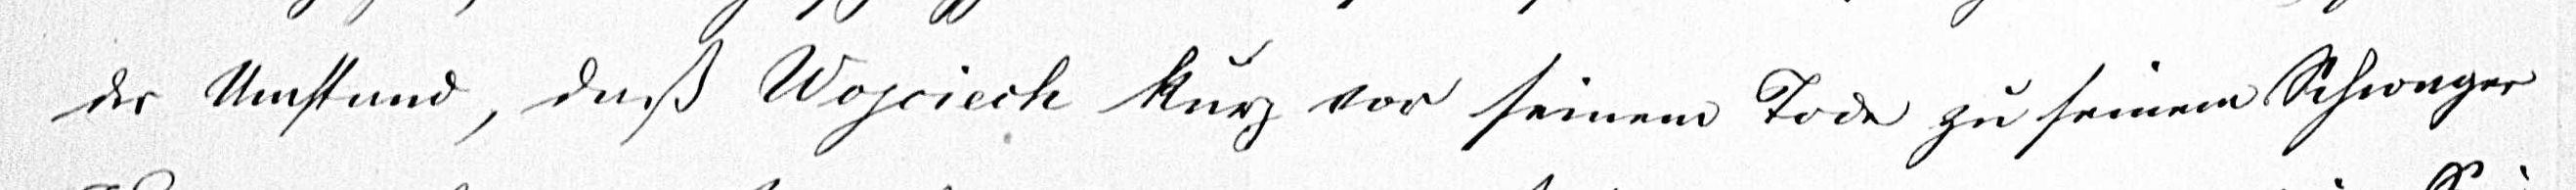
der Umstand, daß Wojciech kurz vor seiner Tode zu seinem Schwager
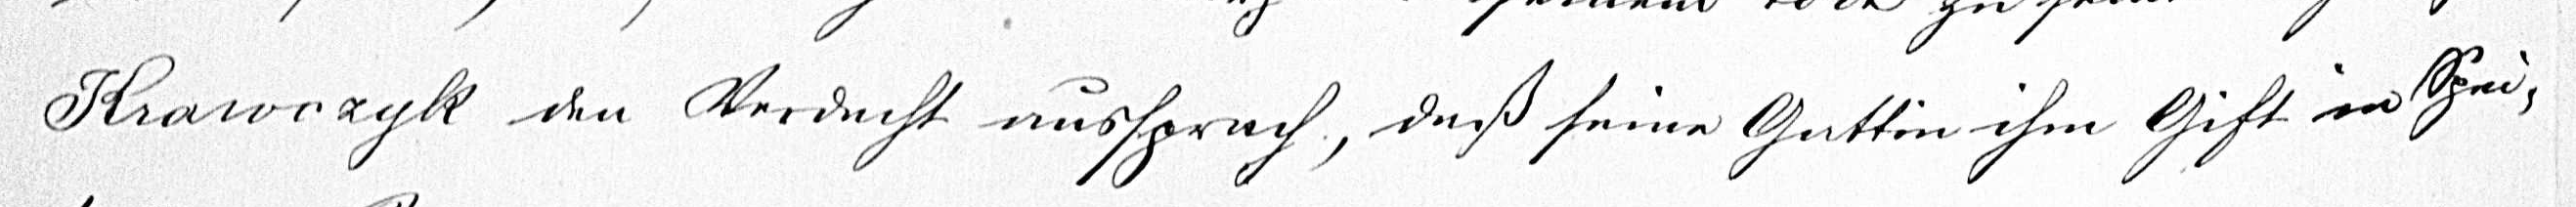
Krawczyk den Verdacht aussprach, daß seine Gattin ihm Gift in Spei¬
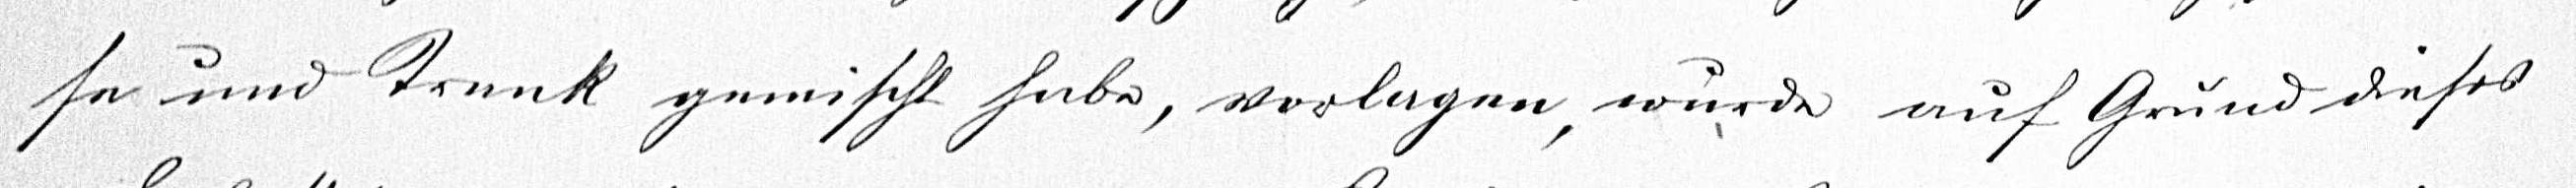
se und Trunk gemischt habe, vorlagen, wurde auf Grund dieses
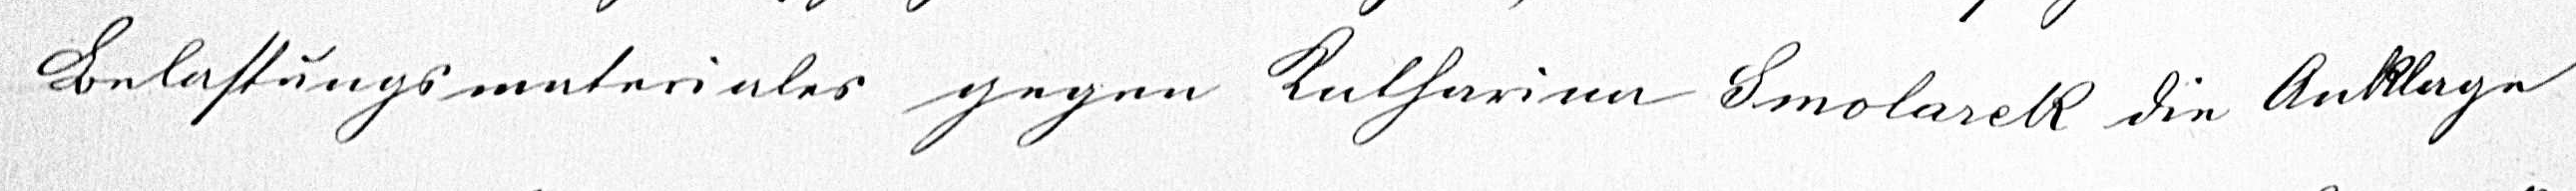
Belastungsmateriales gegen Katharina Smolarek die Anklage
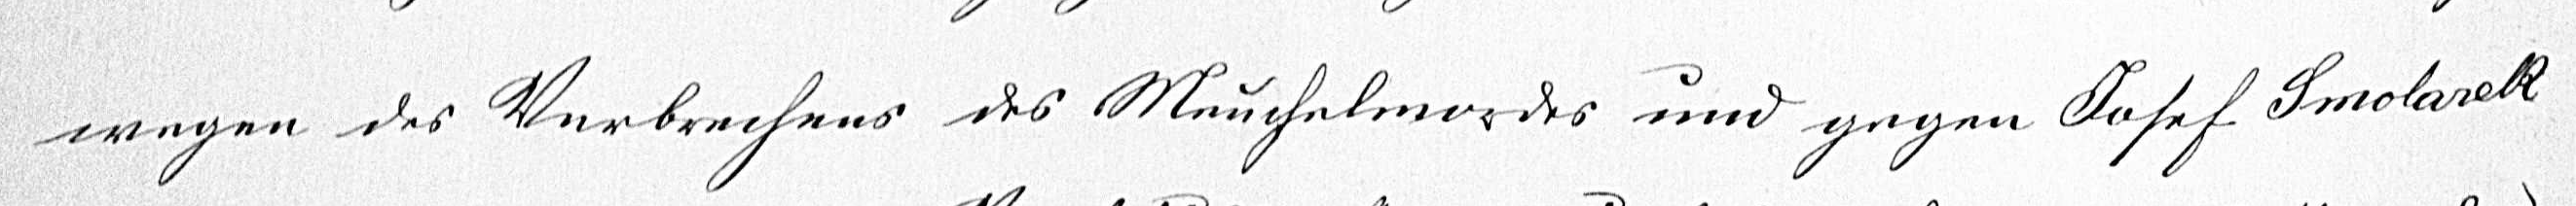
wegen des Verbrechens des Meuchelmordes und gegen Josef Smolarek
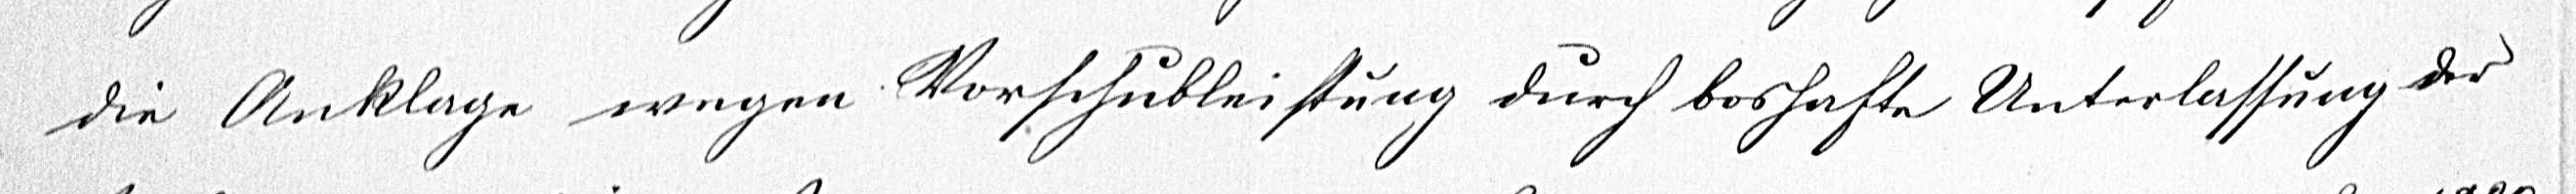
die Anklage wegen Vorschubleistung durch boshafte Unterlassung der
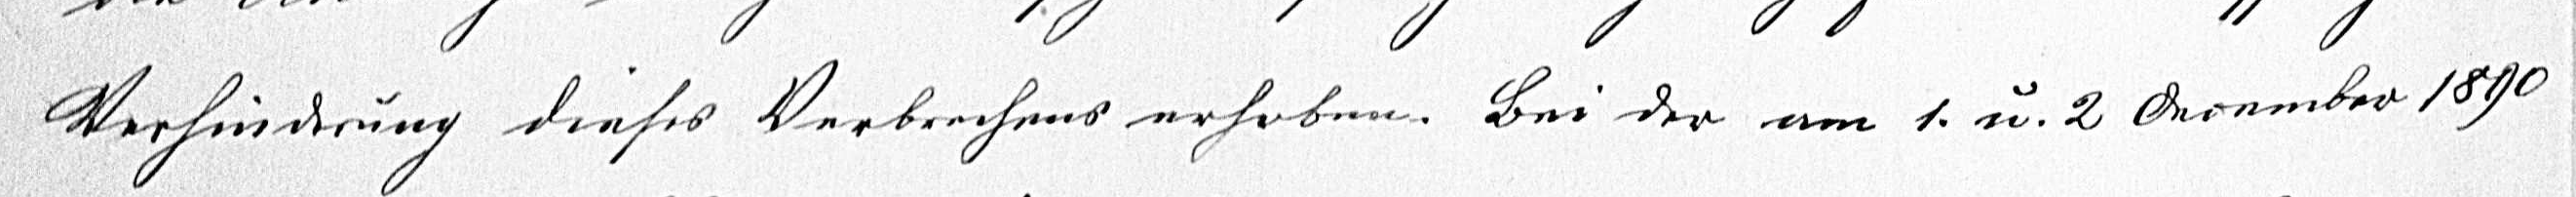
Verhinderung dieses Verbrechens erhoben. Bei der am 1. und 2. December 1890
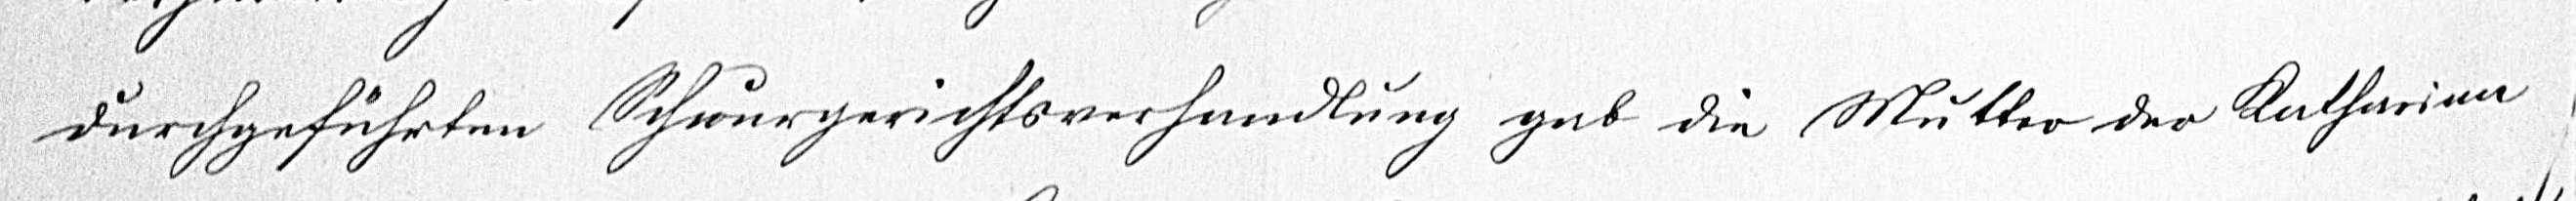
durchgeführten Schwurgerichtshandlung gab die Mutter der Katharina
